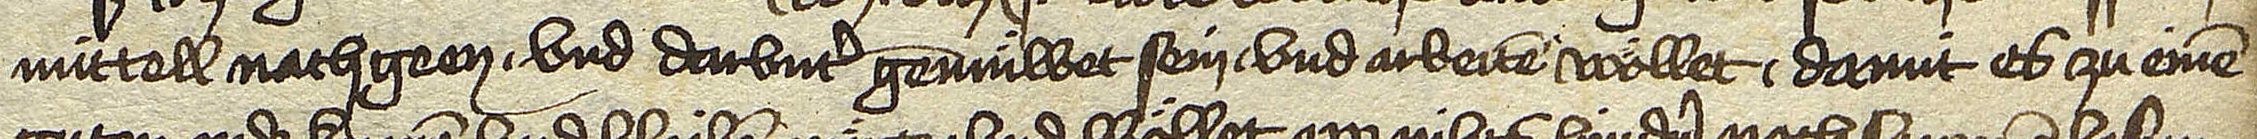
mittell nachgeen / vnd darvnt* gemüwet ſein / vnd arbeite* wöllet / damit es cʒu eine*
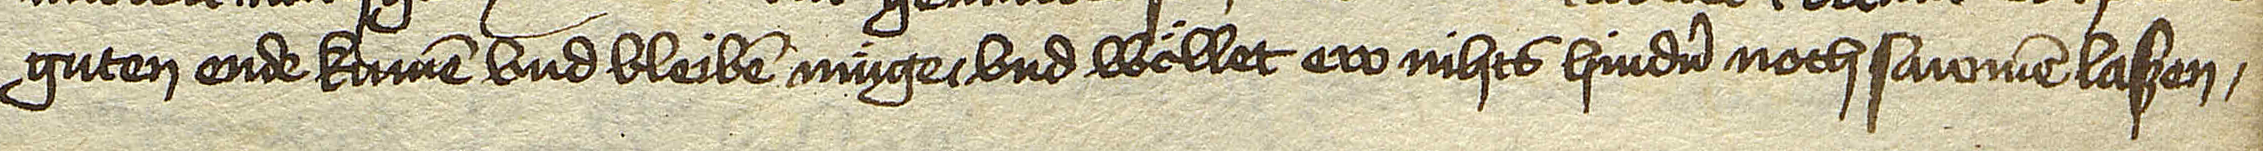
guten ende kume* vnd bleibe* müge / vnd wöllet ew nihts hindn* noch ſawme* laſʒen /
